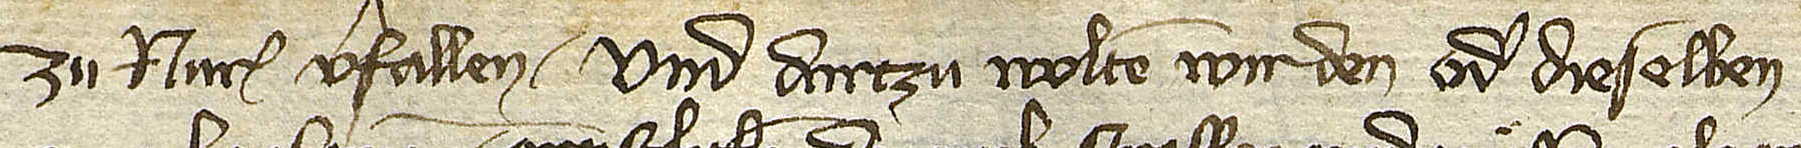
ʒu Nur* v*fallen / Vnd darcʒu wolte* wir den od* dieſelben
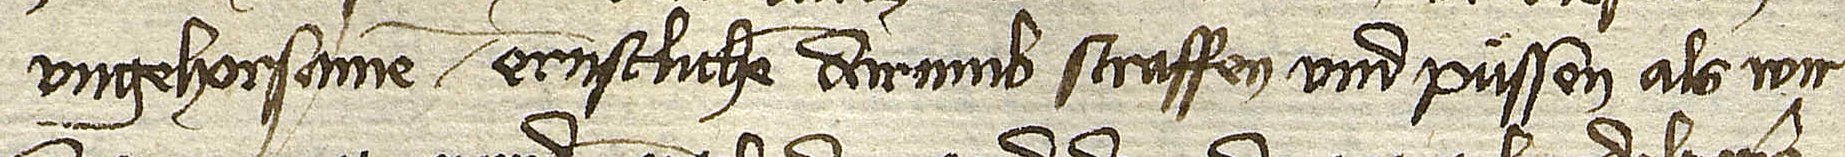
vngehorſame* / ernſtliche* darumb ſtraffen vnd püſſen als wir
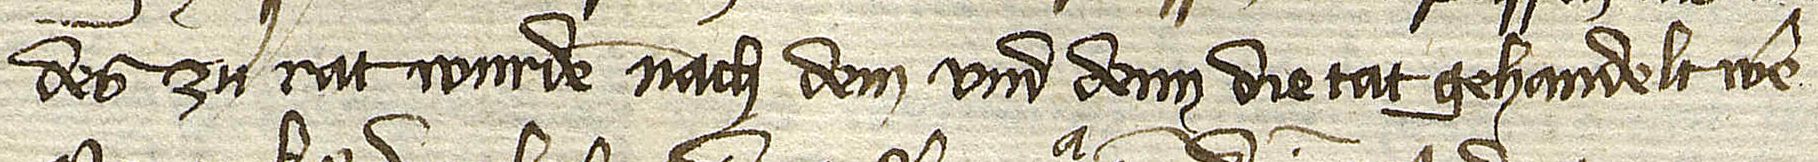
des ʒu rat wurde* nach dem vnd denn die tat gehandelt we*
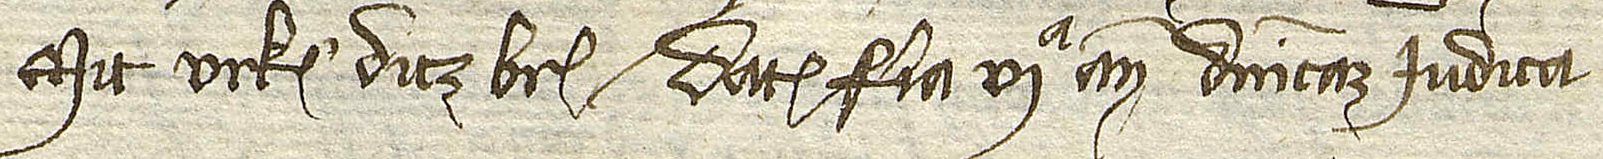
Mit vrk* dicʒ br* / Dat* fia* vi* an* dnica* Iudica
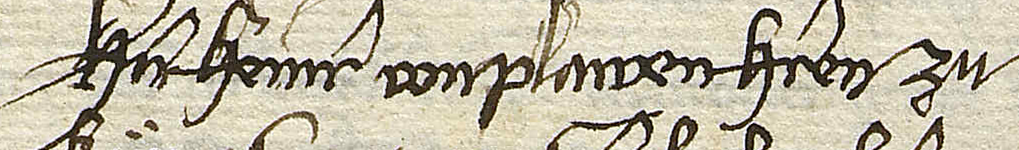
H*n heinr* von plawen h*ren ʒu
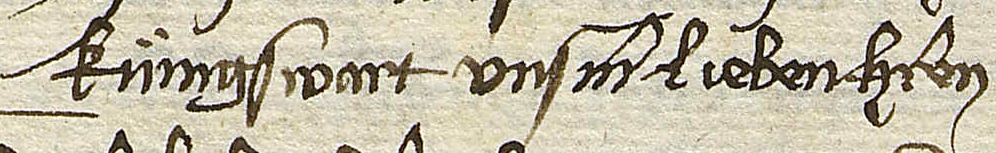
küngſwart vnſ*m lieben h*ren
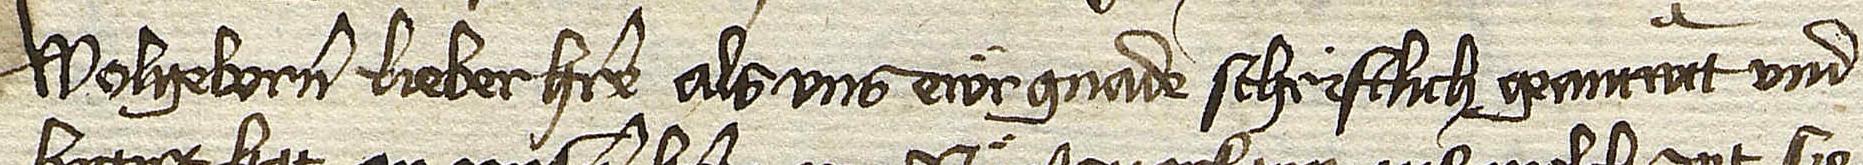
Wolgebor*n lieber h*re als vns ewr gnade ſchriftlich geantw*tt vnd
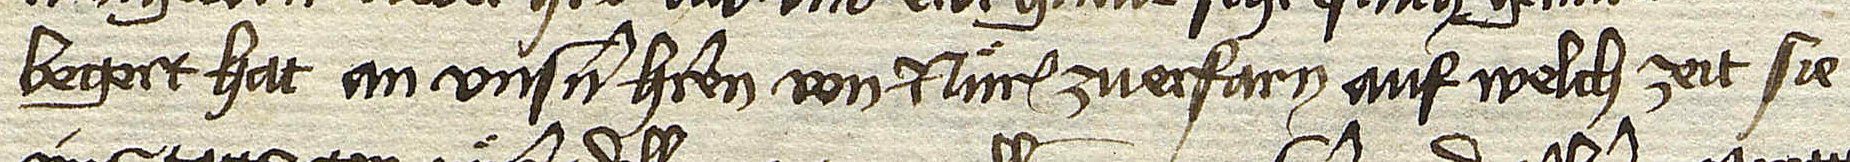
begert hat an vnſ*n h*ren von Nür* ʒuerfarn auf welche ʒeit ſie
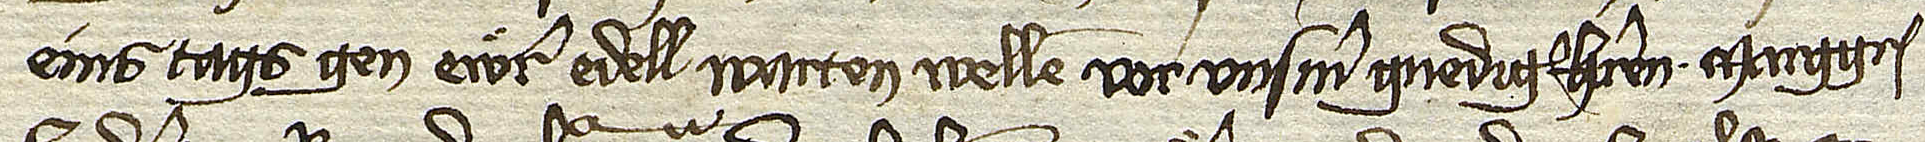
eins tags gen ew*r edell warten welle* vor vnſ*m gnedig* h*ren . Marggr*
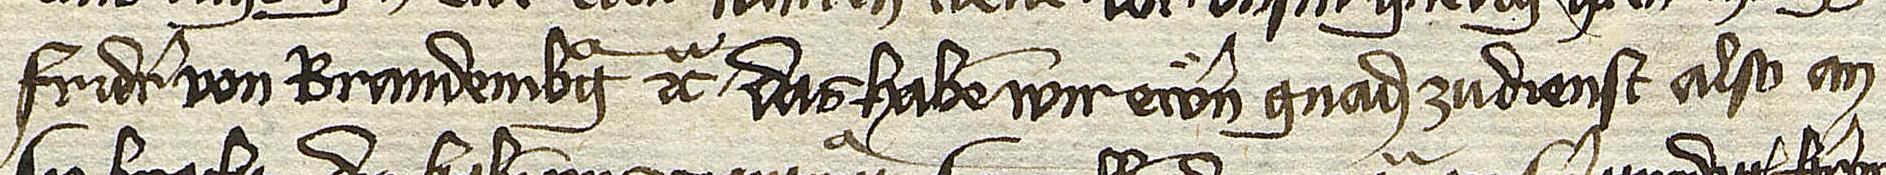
Fridr* von Brandemb*g ec* / Das habe* wir ew*n gnad* ʒu dienſt alſo an
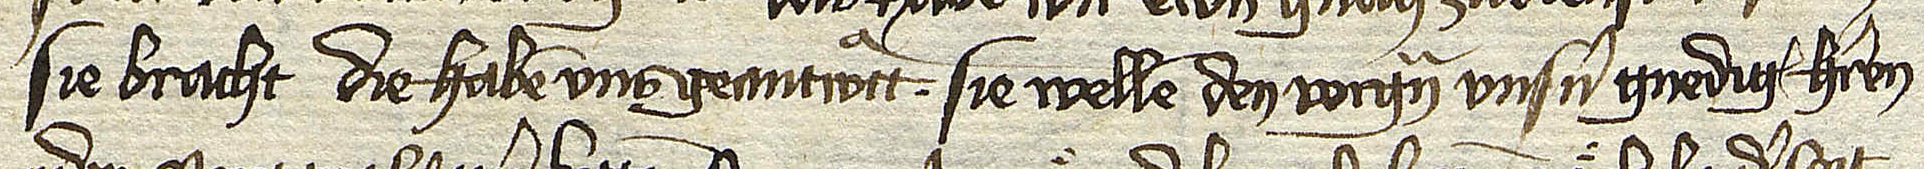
ſie bracht die habe* vns geantw*tt . ſie welle* den vorg*n vnſ*n gnedig* h*ren
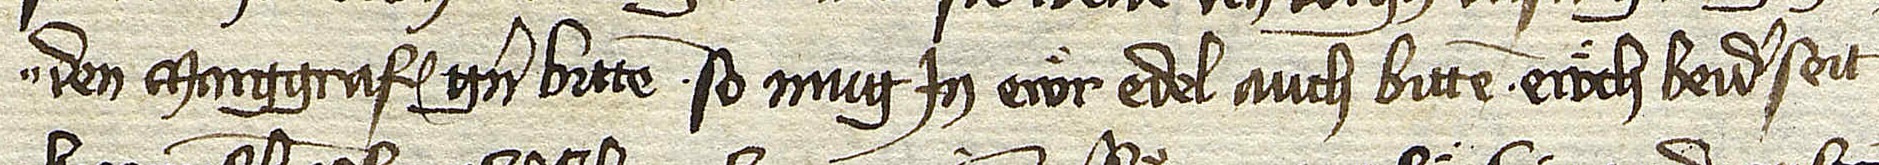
~ den Marggraf* g*n bitte* . ſo mug In ewr edel auch bitte* . ewch beid*ſeit
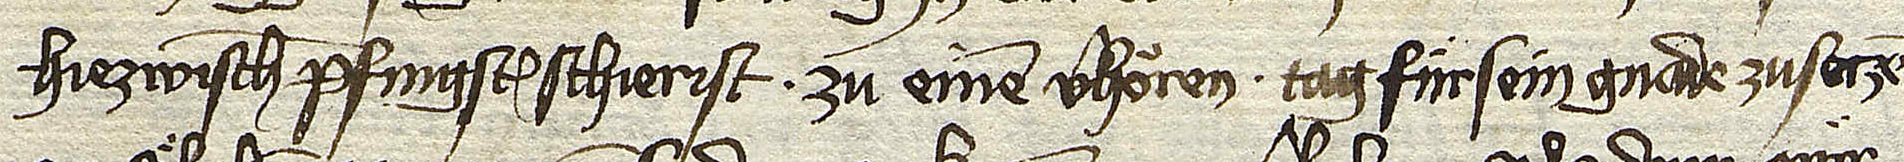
hieʒwiſch* Pfingſt* ſchieriſt . ʒu eine* v*hören . tag für ſein gnade ʒuſecʒe*
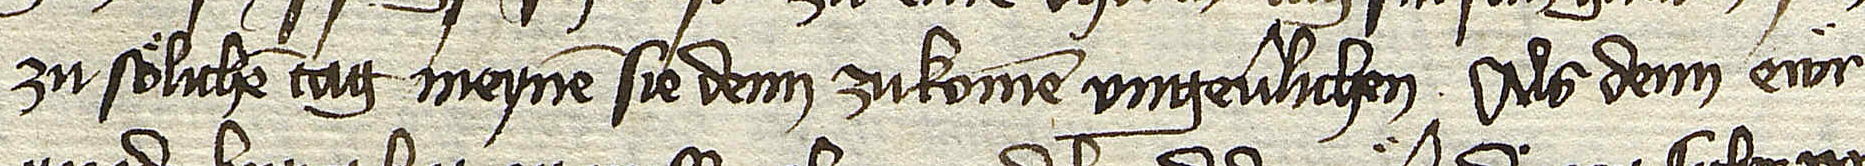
ʒu ſöliche* tag meyne* ſie denn ʒu kome* vngeu*lichen . Als denn ewr
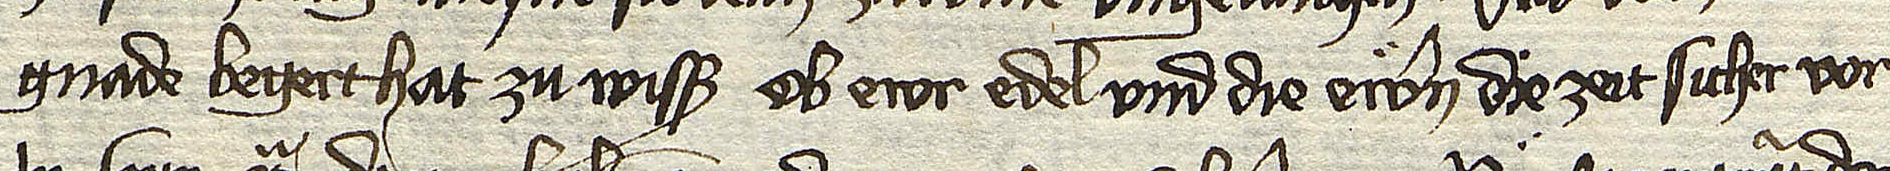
gnade begert hat ʒu wiſſ* Ob ewr edel vnd die ew*n die ʒeit ſicher vor
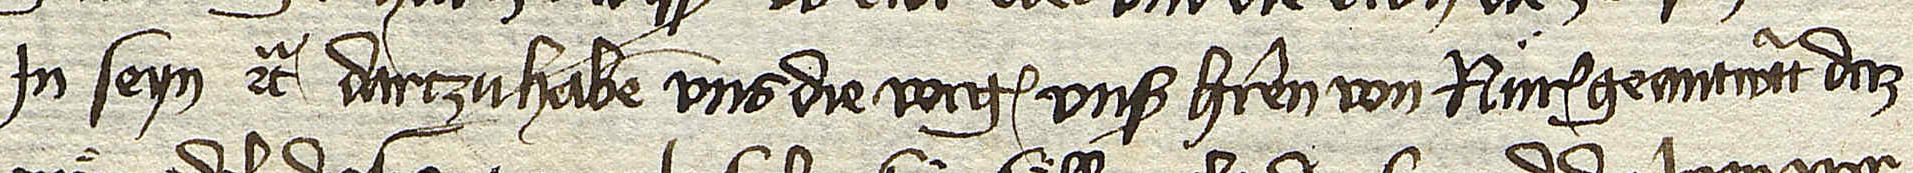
In ſeyn ec* darcʒu habe* vns die vorg* vnſ* h*ren von Nür* geantw*tt daʒ
